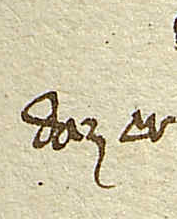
daʒ er
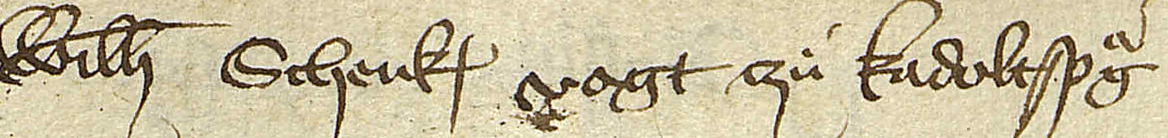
Wilh* Schenk* vogt cʒü kadoltſp*g
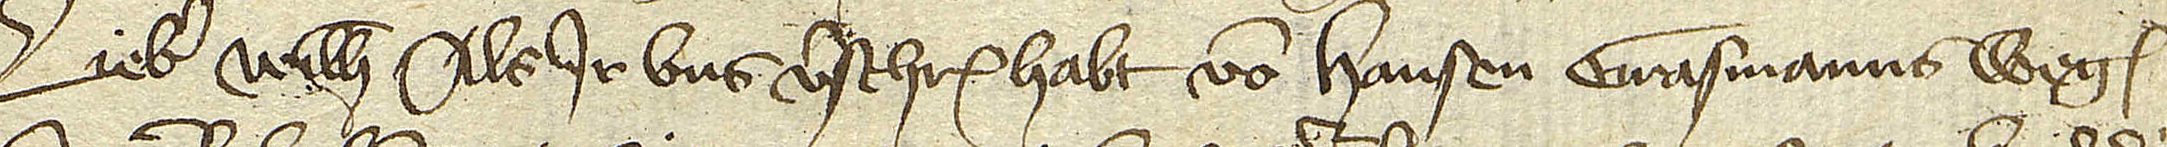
Lieb* wilh* / Als Ir vns v*ſchr* habt vo* Hanſen Graſmanns weg*
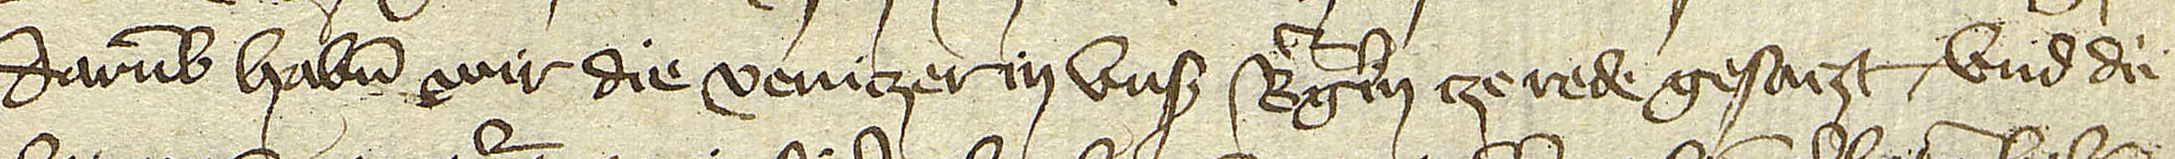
darub* habn* wir die venicʒer in vnſ* B*g*in cʒerede geſacʒt / vnd die
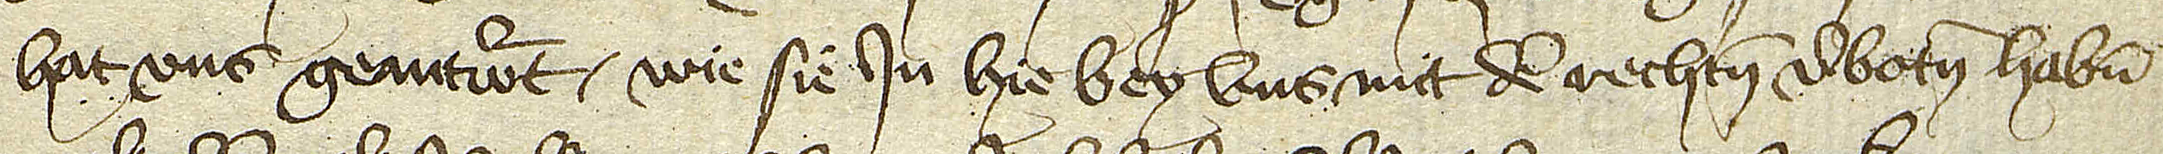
hat vns geantwt* / wie ſie In hie bey vns mit d* rechtn* v*botn* habn*
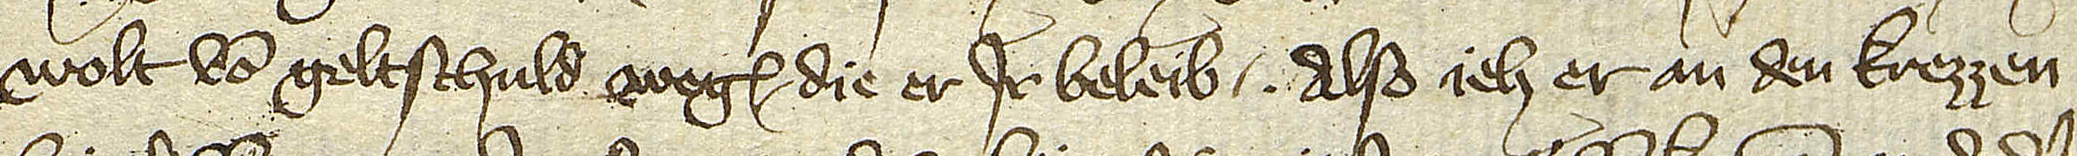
wolt vo* geltſchuld weg* / die er Ir beleib / . Alſo ieh er an den kreʒʒen
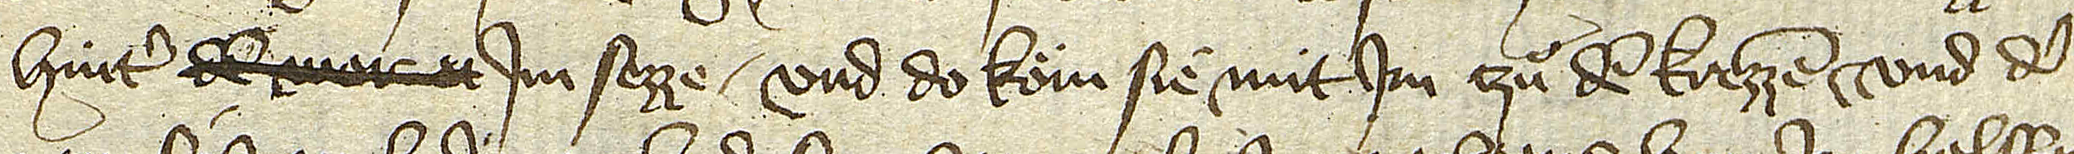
hint* d* wer et Im ſeʒʒe / vnd do köm ſie mit Im cʒü d* kreʒʒe* / vnd d*
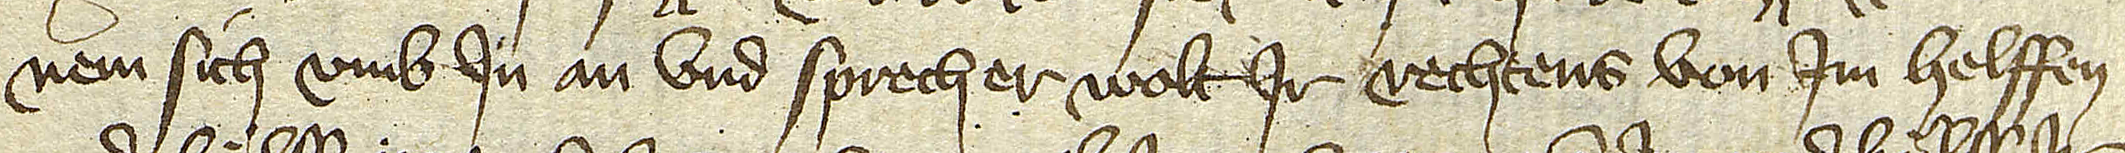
nem ſich vmb In an vnd ſprech er wolt Ir rechtens von Im helffen
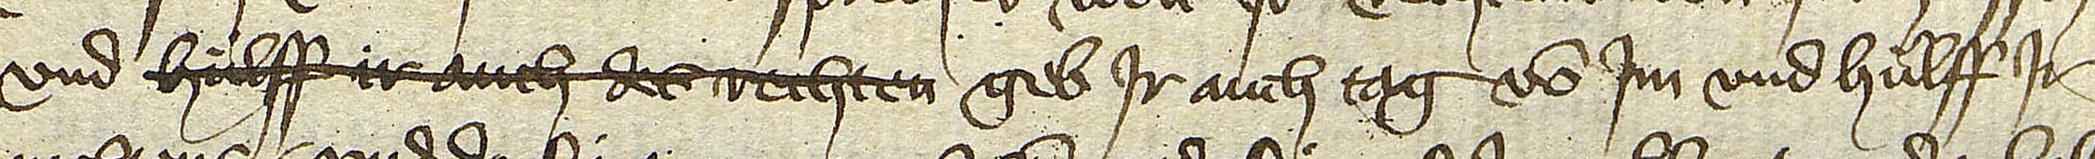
vnd hülff ir auch des rechten geb Ir auch tag vo* Im vnd hülff Ir
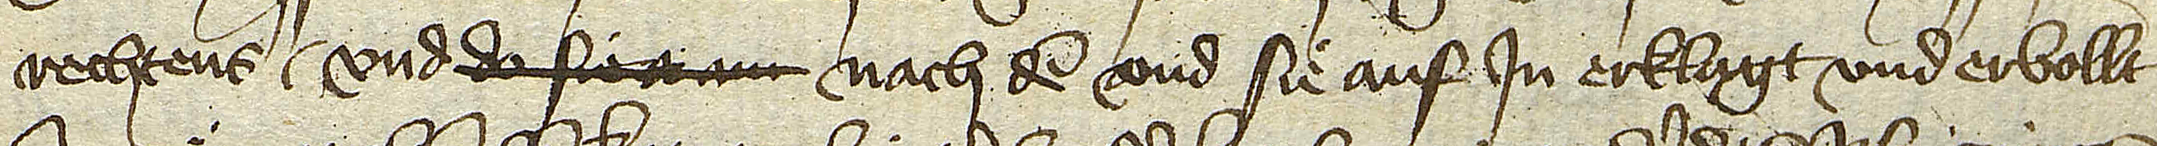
rechtens / vnd do ſie a an nach d* vnd ſie auf In erklagt vnd ervollt
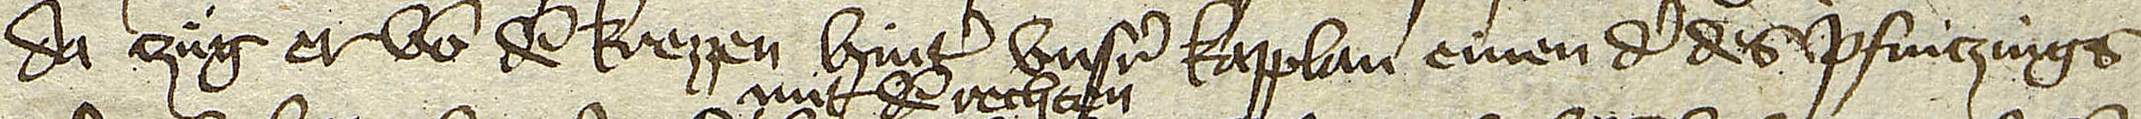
da cʒüg er vo* d* kreʒʒen hint* vnſr* kapplan einen d* des Pfincʒings
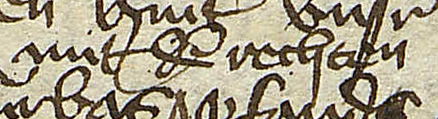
mit d* rechten
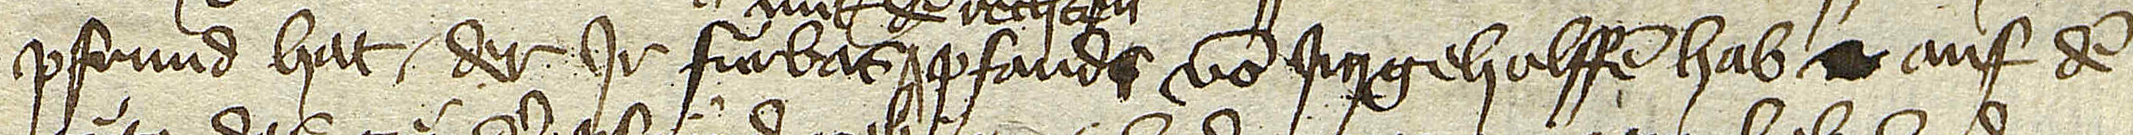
pfrund hat / der Ir fürbas pfands vo* Im geholffe* hab % auf d*
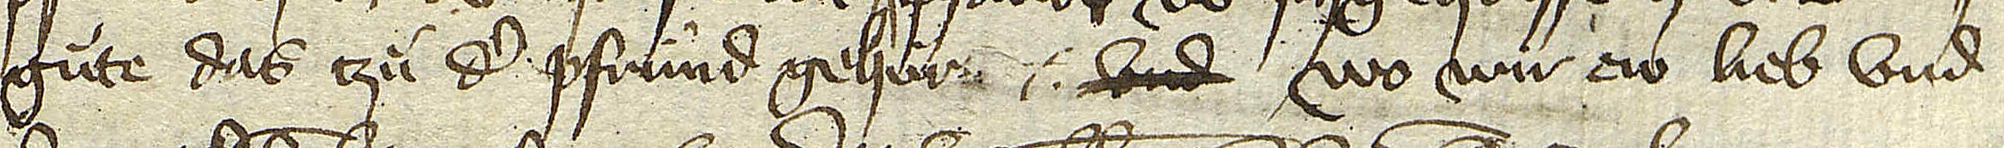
güte das cʒü d* pfünd gehör / . vnd wo wir ew lieb vnd
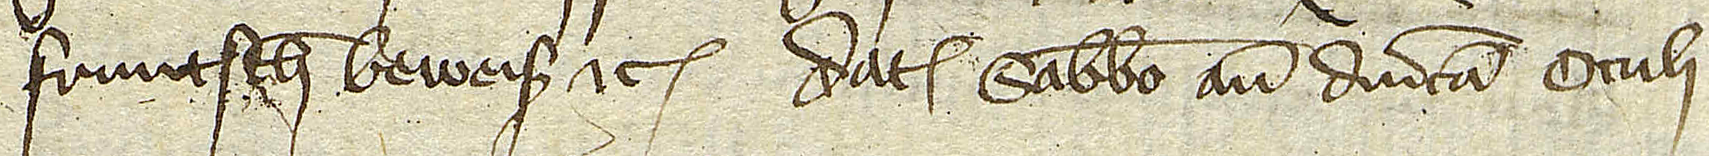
fruntſch* beweiſ* ec* Dat* Sabbo* an* dmica* Oculi
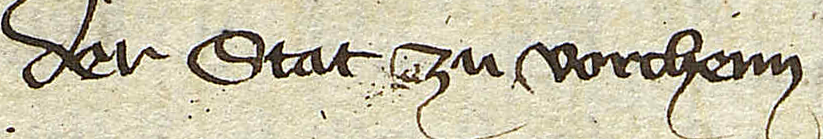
Der Stat cʒu vorcheim
